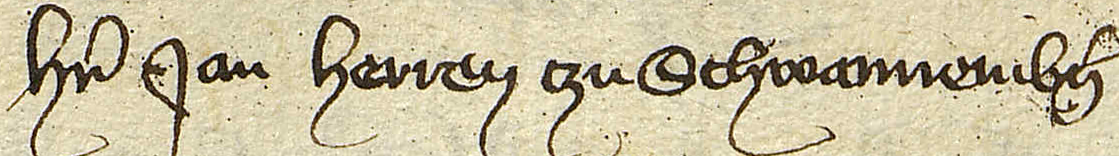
hn* Ian herren cʒu Schwannembg*
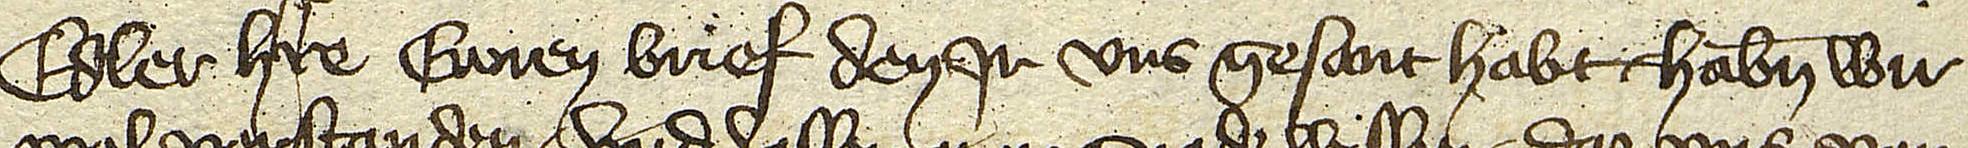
Edler h*re Ewren brief den Ir vns geſant habt / habn* wir
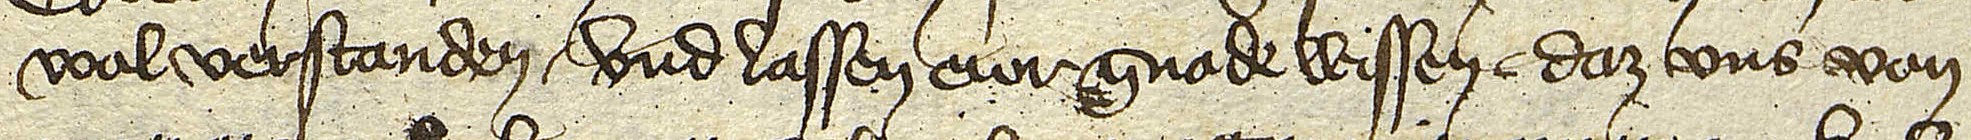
wol verſtanden / vnd laſſen ewr gnade wiſſen / daʒ vns von
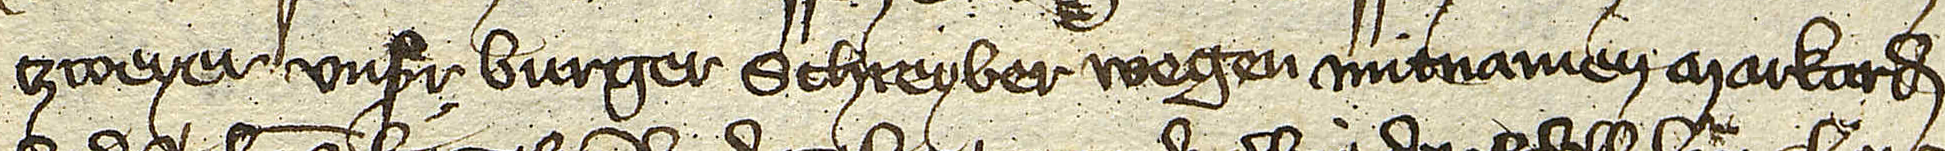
cʒweyer vnſ*r burger Schreyber wegen mitnamen Markard*
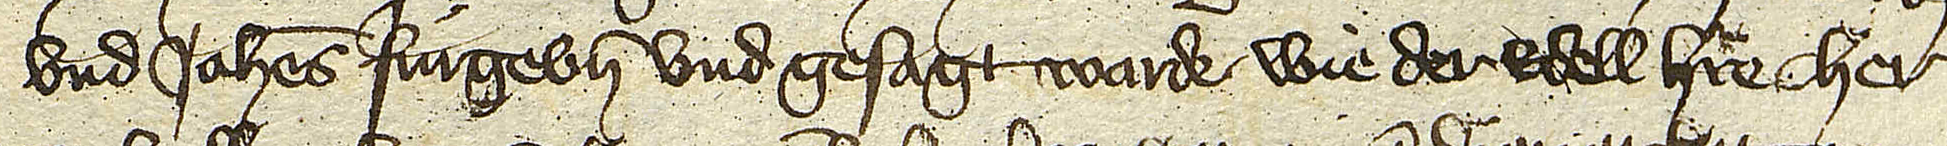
vnd Iohes* fürgebn* vnd geſagt warde / wie der Edell h*re / her
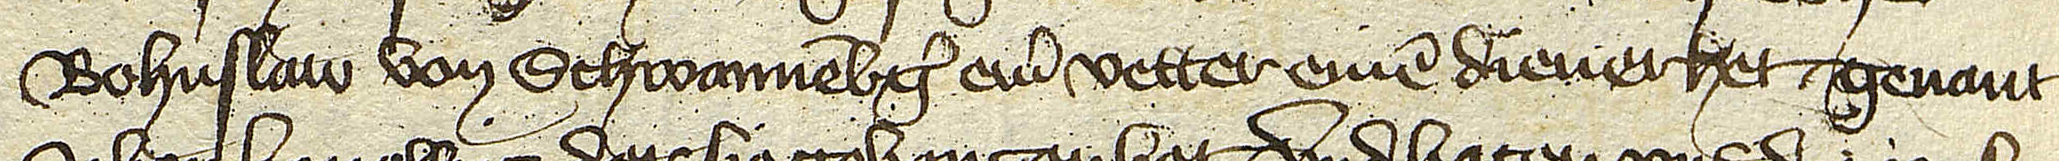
Bohuſlaw von Schwanne*bg* ew* vetter eine* diener het / genant
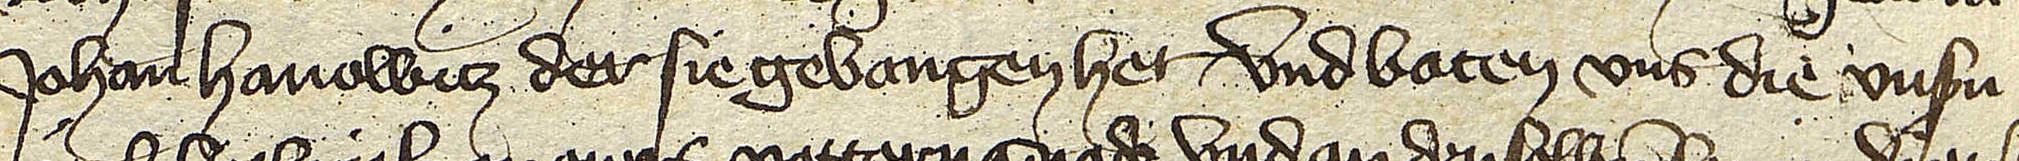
Iohan hanowicʒ der ſie gevangen het / vnd boten vns die vnſ*n
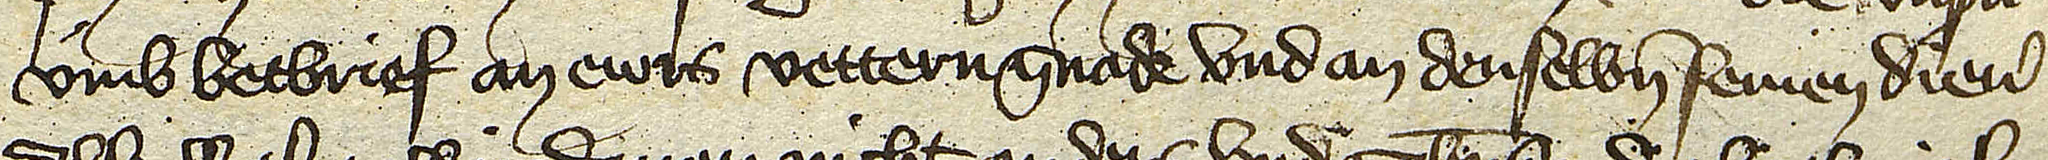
v̈mb betbrief an ewrs vettern gnade vnd an denſelbn* ſeinen dien*
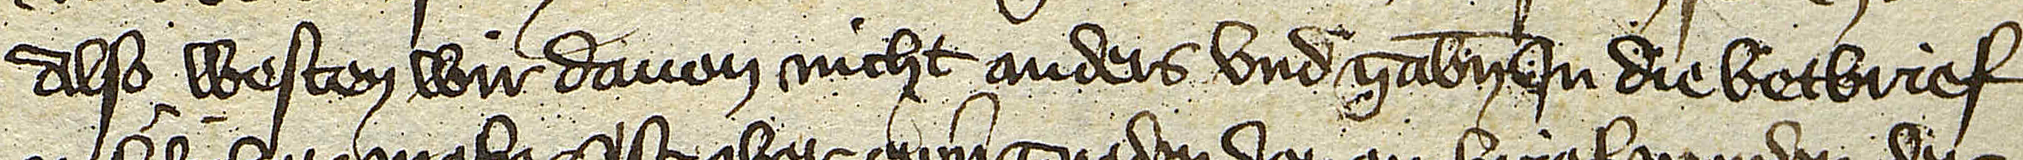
Alſo weſten wir dauon nicht anders vnd gabn* In die betbrief
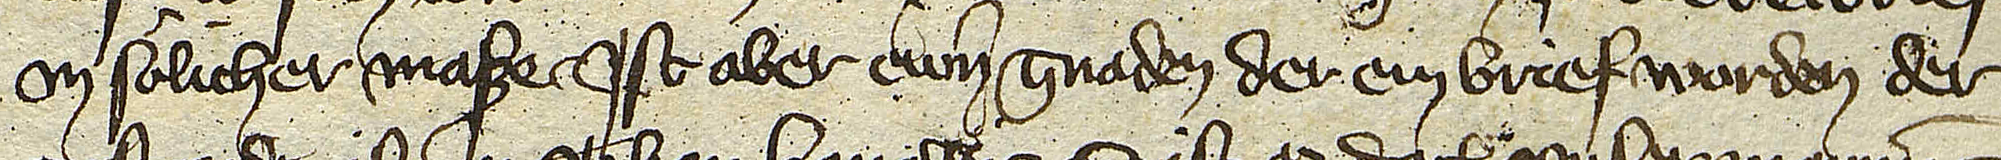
in ſölicher maſʒe / Iſt aber ewn* gnaden der ein brief worden der
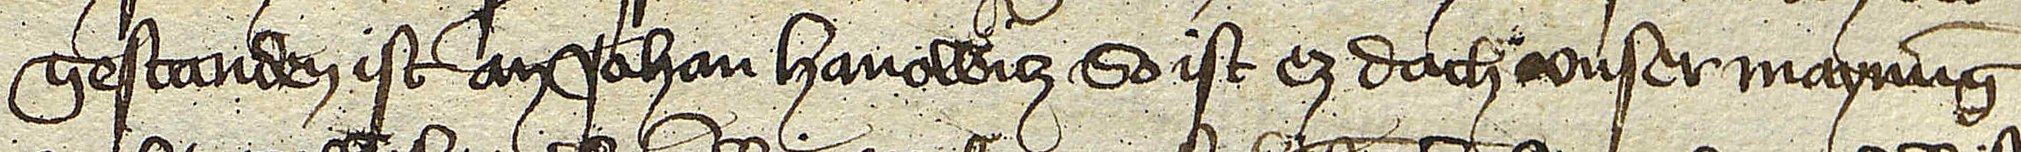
geſtanden iſt an Iohan hanowicʒ / So iſt eʒ doch vnſer manug*
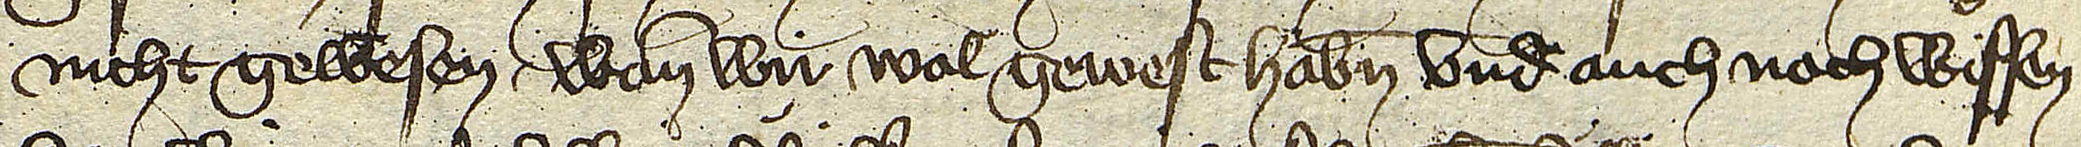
nicht geweſen / wan* wir wil geweſt habn* vnd auch noch wiſſen
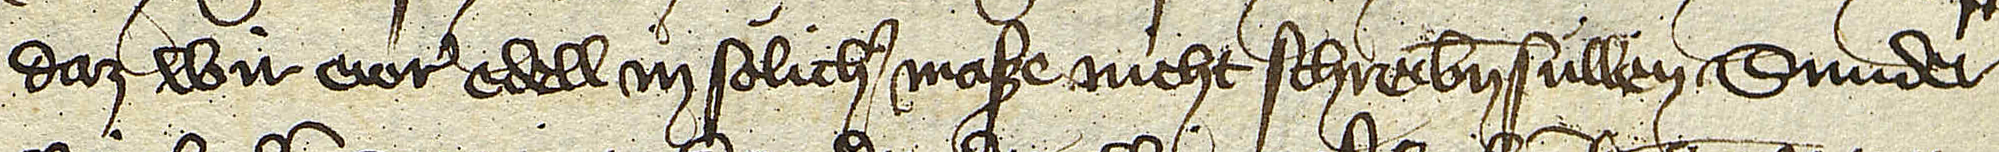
daʒ wir ewr* edell in ſölich* maſʒe nicht ſchreibn* ſüllen / Sunder
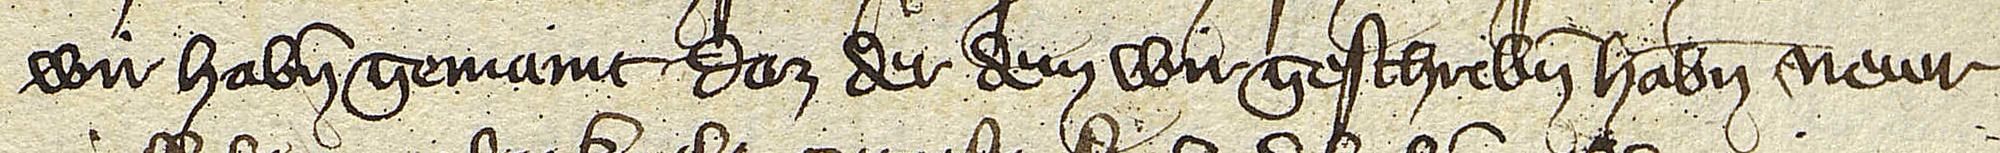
wir habn* gemaint / daʒ der dem wir geſchribn* habn* newr
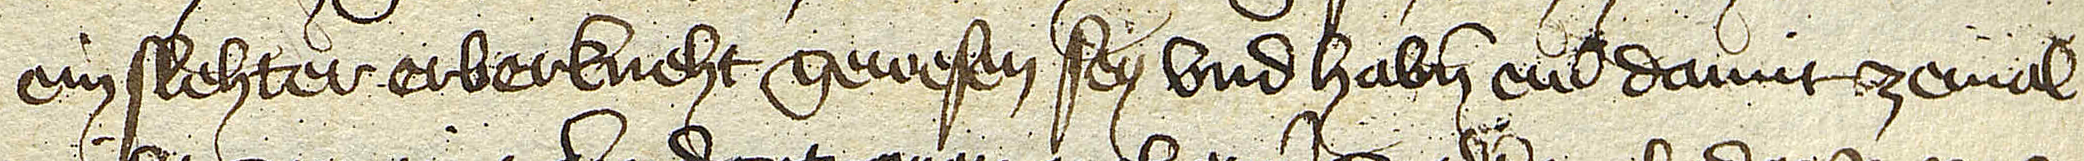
ein ſlehter erberkneht geweſen ſey vnd habn* ew* damit cʒemal
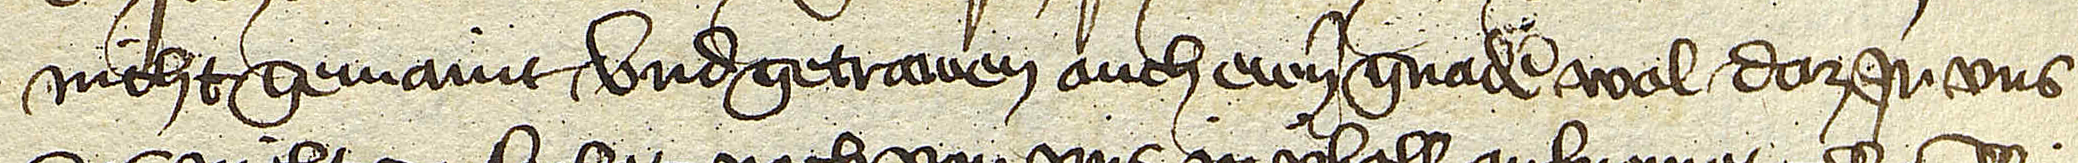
nicht gemaint / vnd getrawen auch ewn* gnad* wol / daʒ Ir vns
